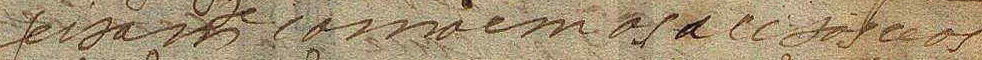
feitamte como em os alltos ceos
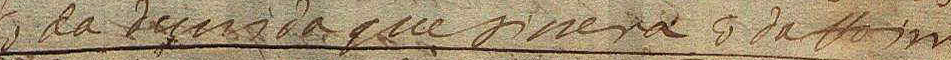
& da duuida que tiuera & da Roim
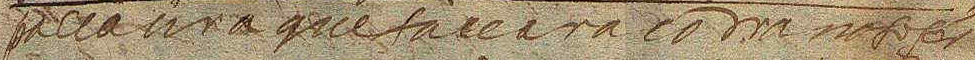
pallaura que fallara cōtra noso sōr
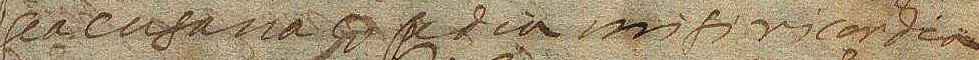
se acusaua & pedia misiricordia
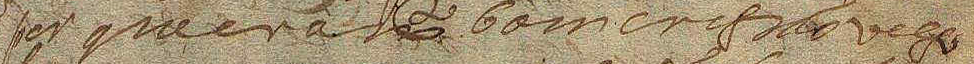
porque era mto bom cristaõ velho
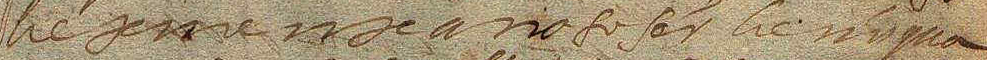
he temente a noso sor̄ he nūqua
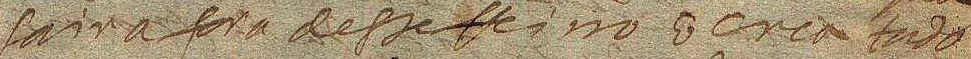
saira fora deste Reino & cria tudo
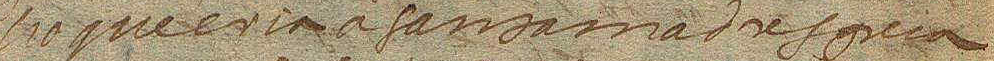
ho que cria a santa madre jgreia
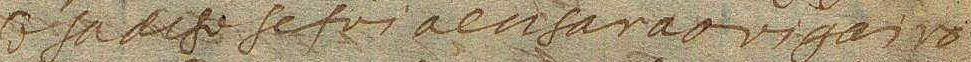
& ja diso se foi acusar ao vigairo
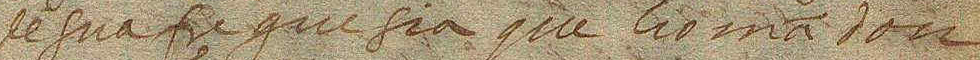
de sua freguesia que ho mādou
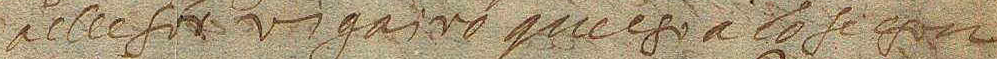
a elle sor̄ vigairo que lho acōselhou
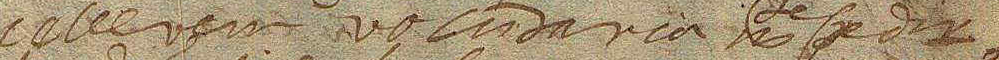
e elle vem volūtariamte pedir
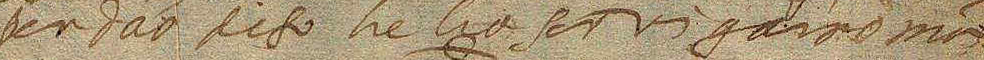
perdaõ diso he ho sor̄ vigairo maõ
